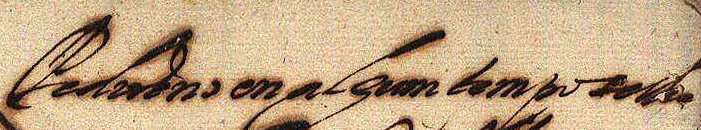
Pedirēno en algum tempo se lhe
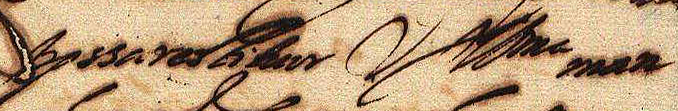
possa restituir V Jllma man
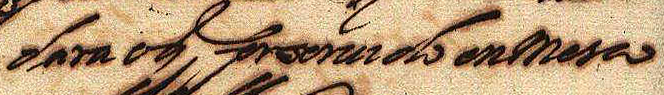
dara o q̄ for seruido en mesa
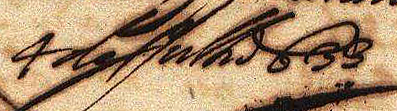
4 de Julho 633
